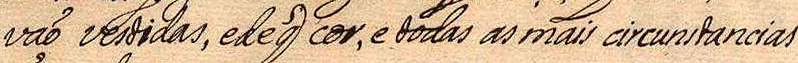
vaõ vestidas, e de q̄ cor, e todas as mais circunstancias
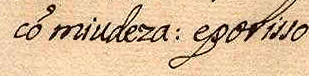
cō miudeza: e por isso
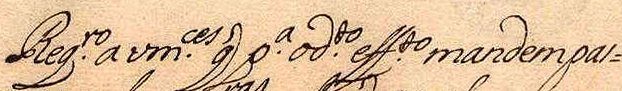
Req.ro a vm.ces q̄ p.a o d.to off.o mandem pas
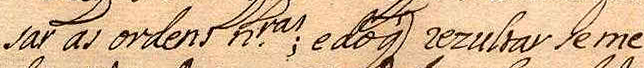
sar as ordens n.ras; e do q̄ rezultar se me
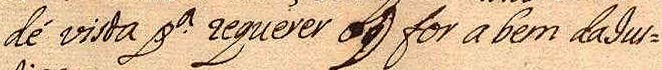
dé vista p.a requerer o q̄ for a bem da Ius
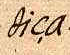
tiça.
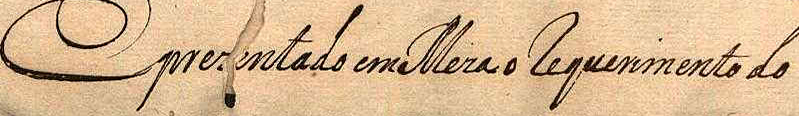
E prezentado em Meza o Requerimento do
